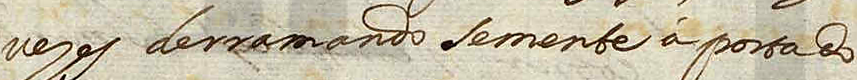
vezes derramando semente á porta do
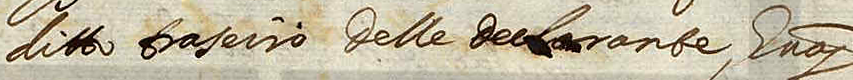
ditto traseiro delle declarante huãs
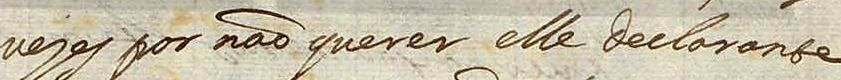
vezes por não querer elle declarante
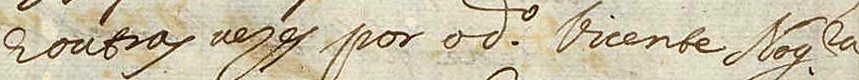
e outras vezes, por o d.o Vicente Nogueira
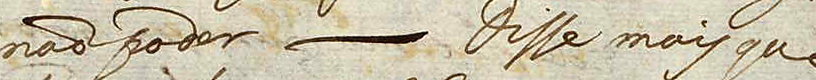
não poder — Disse mais que
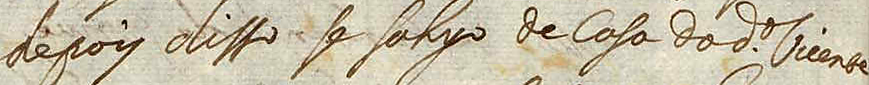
depois disso se sahyo de casa do d.º Vicente
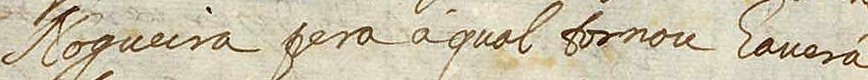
Nogueira pera à qual tornou haverá
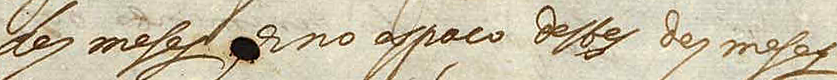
dez meses e no espaço destes dez meses
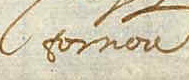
tornou
